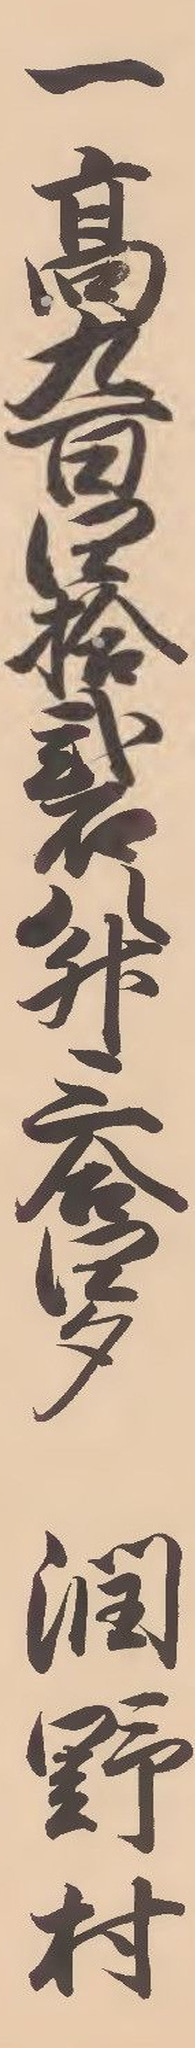一高九百四拾弐石八升三合四勺潤野村
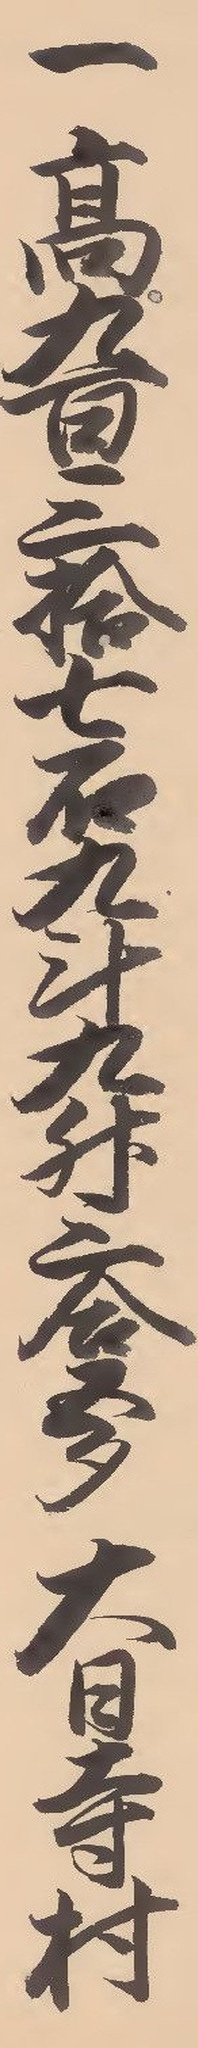一高九百三拾七石九斗九升三合五勺大日寺村
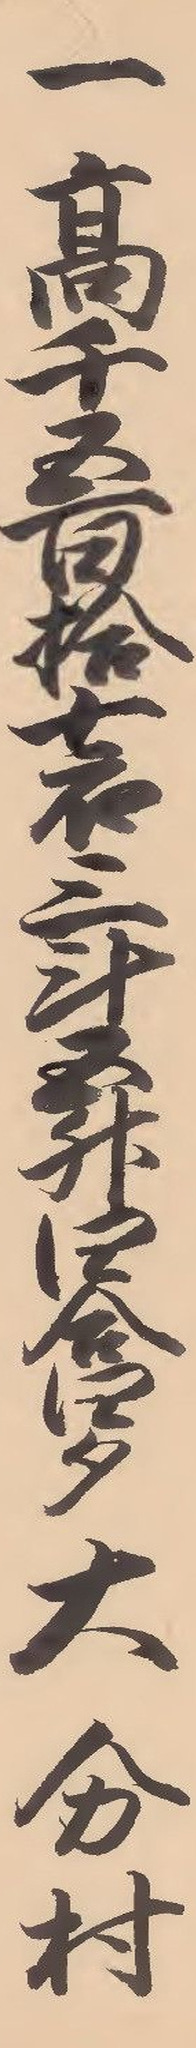一高千五百拾七石三斗五升四合四勺大分村
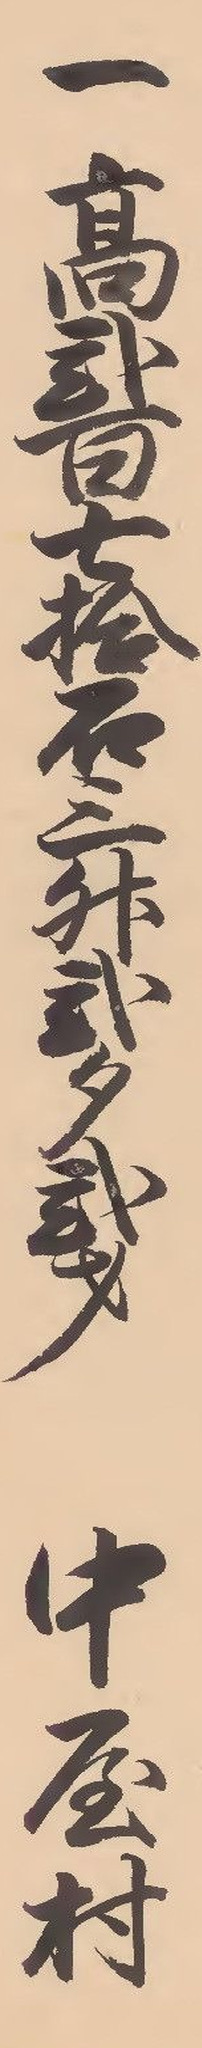一高弐百七拾石三升弐勺弐才中屋村

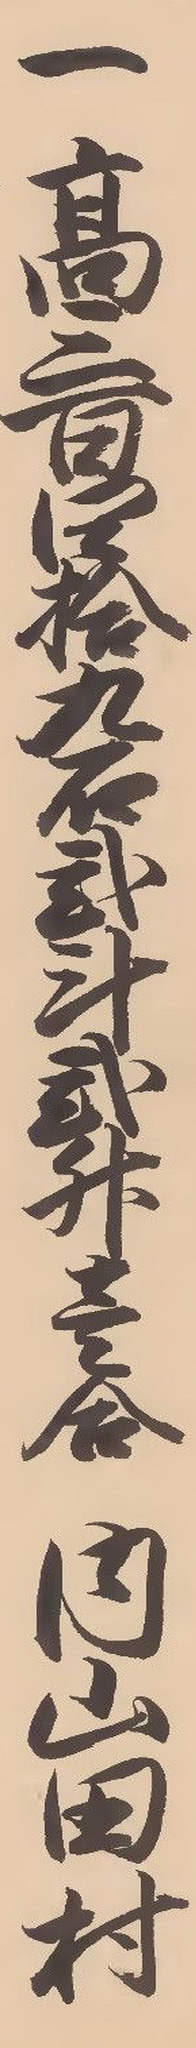一高三百四拾九石弐斗弐升壱合内山田村
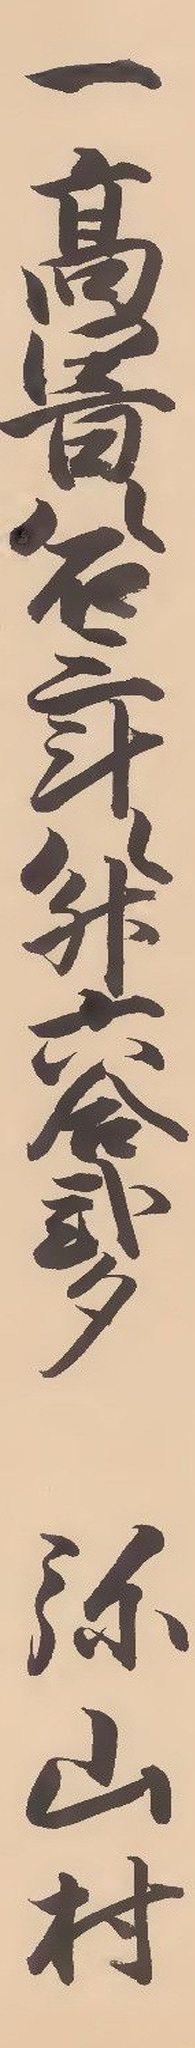一高四百八石三斗八升六合弐勺弥山村
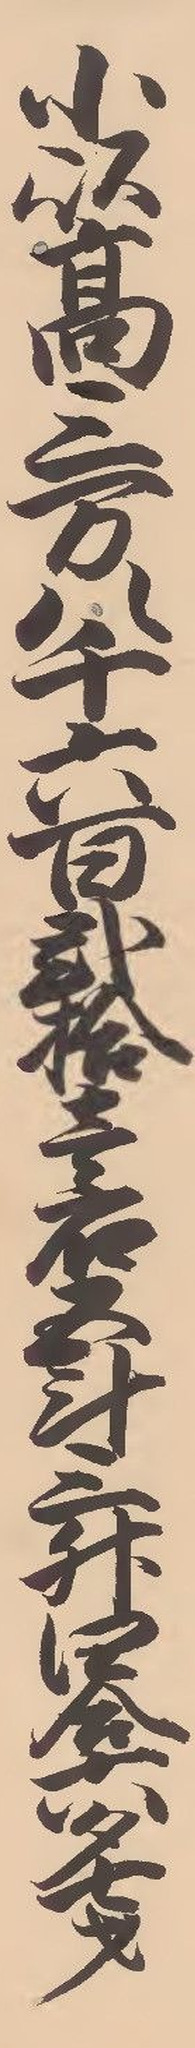小以高三万八千六百弐拾壱石五斗三升四合六勺七才

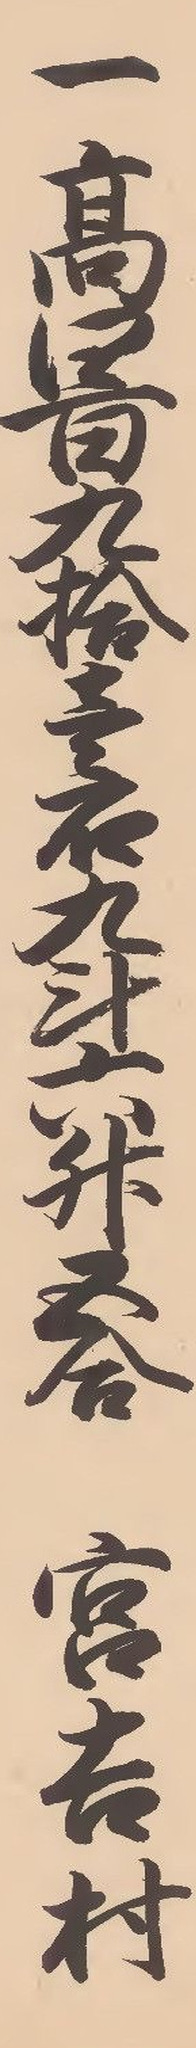一高四百九拾壱石九斗六升五合宮吉村
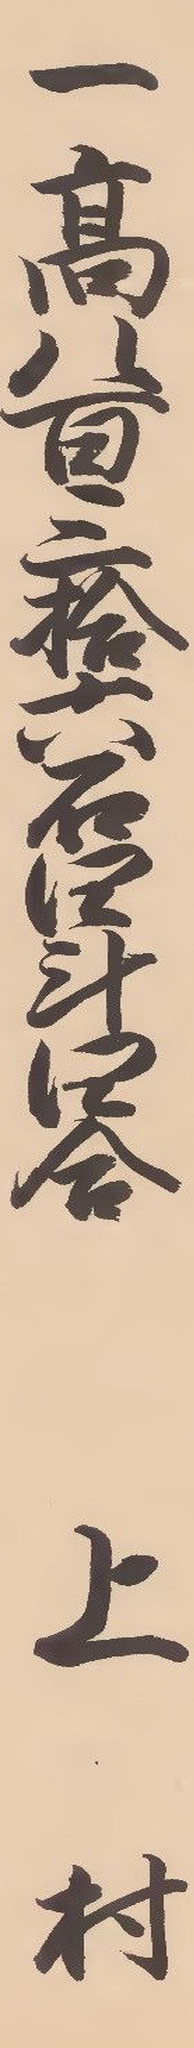一高八百三拾六石四斗四合上村
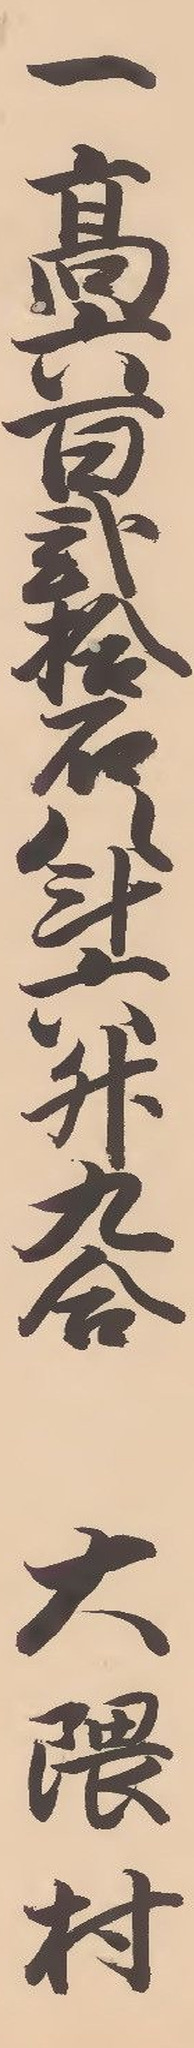一高六百弐拾石八斗六升九合大隈村
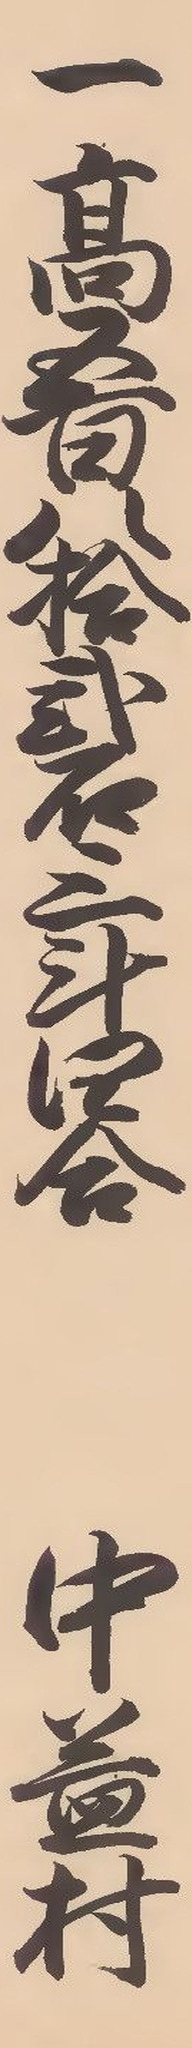一高五百八拾弐石三斗四合中益村
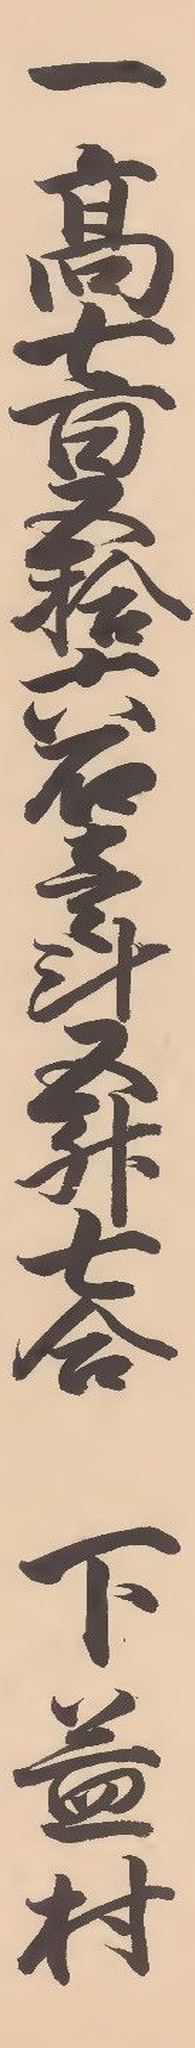一高七百五拾六石壱斗五升七合下益村

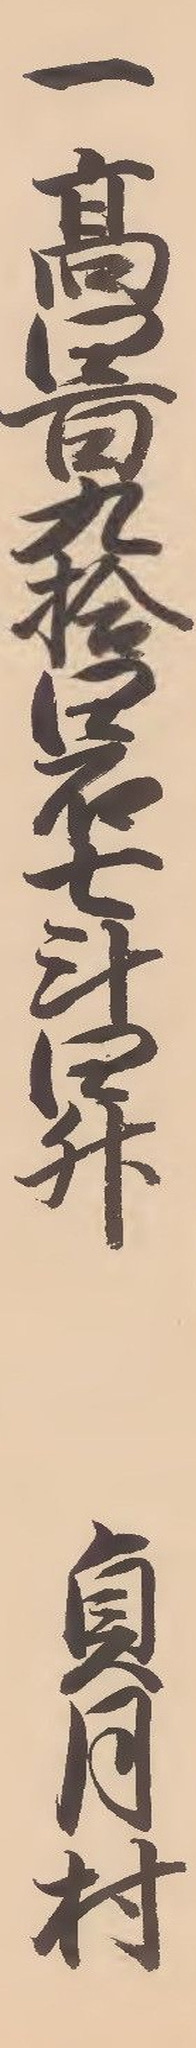一高四百九拾四石七斗四升貞月村
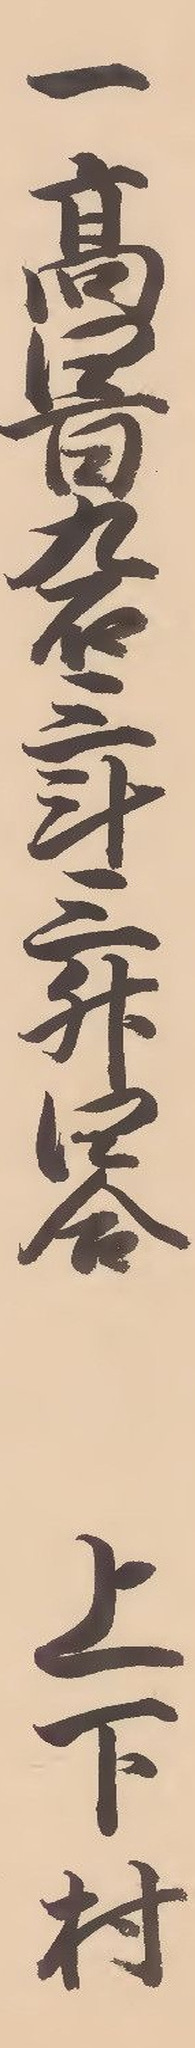一高四百九石三斗三升四合上下村
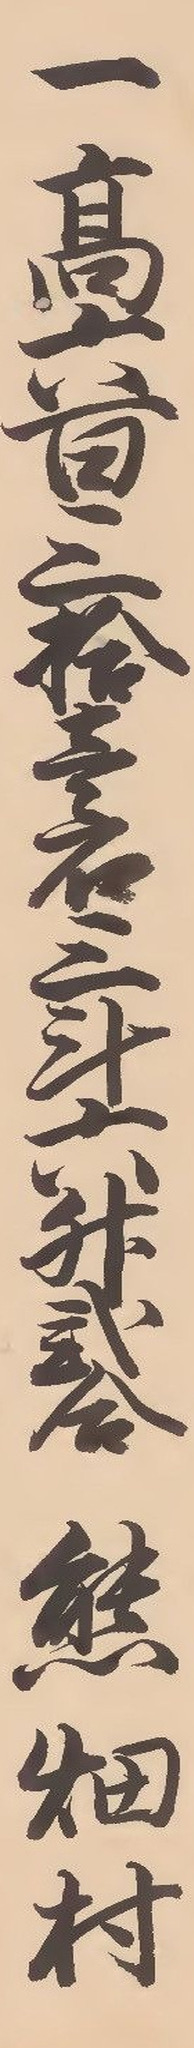一高六百三拾壱石三斗六升弐合熊畑村
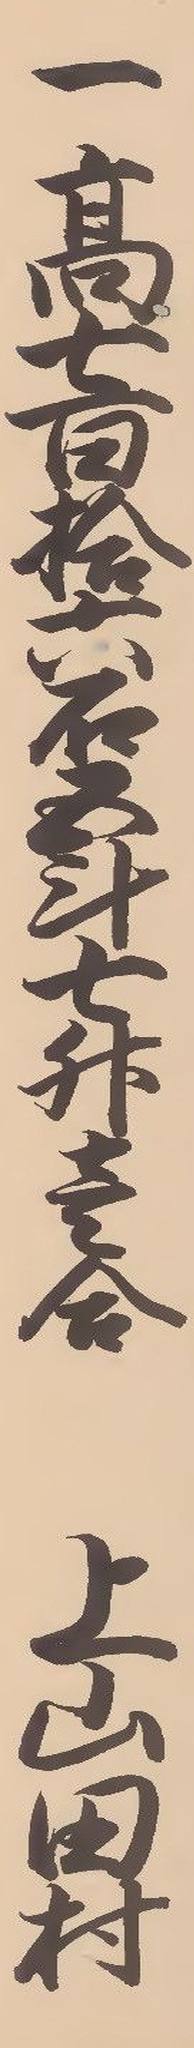一高七百拾六石五斗七升壱合上山田村
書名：筑前国郷帳
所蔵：国立公文書館 National Archives of Japan
